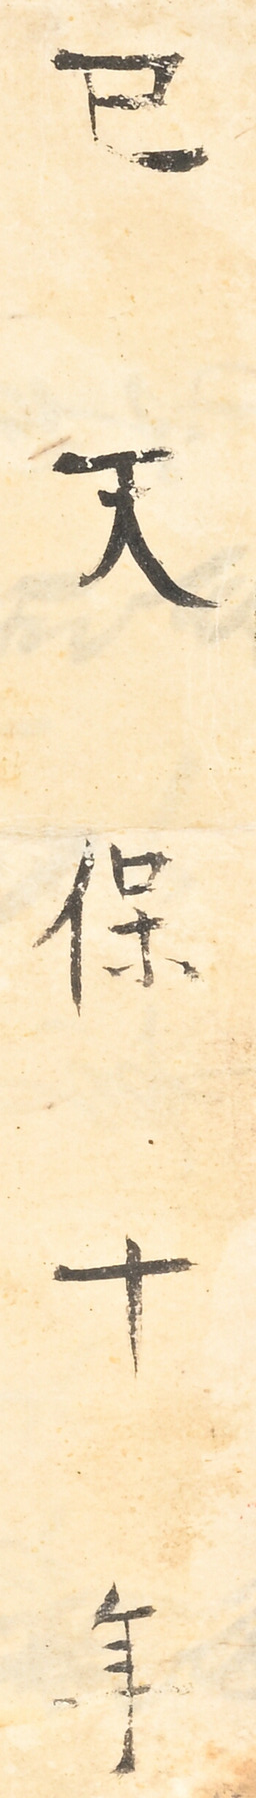己天保十年
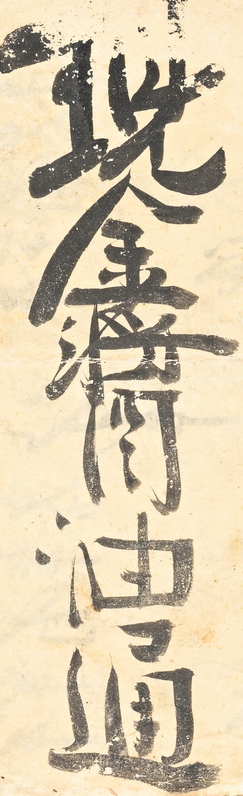現金醤油通
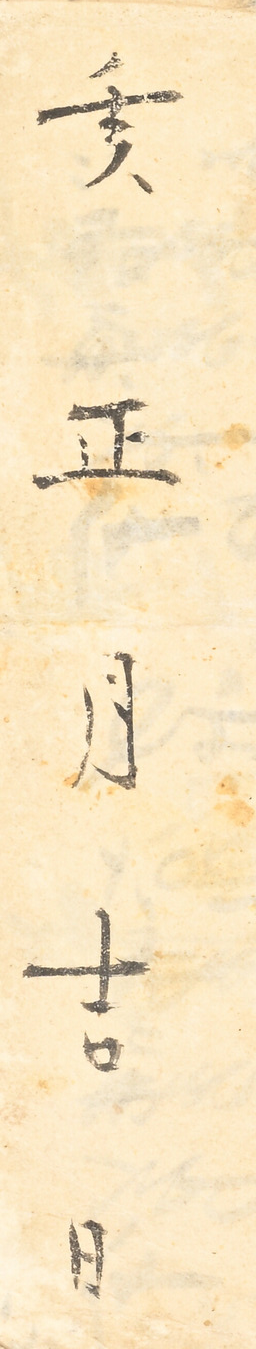亥正月吉日
